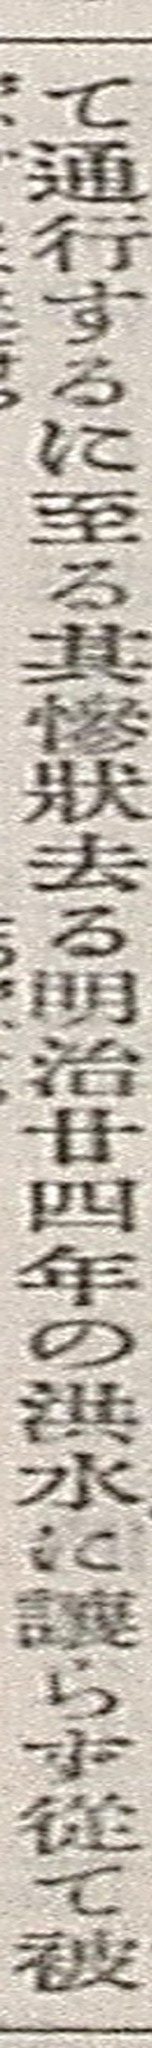て通行するに至る其惨状去る明治廿四年の洪水に譲らず従て被
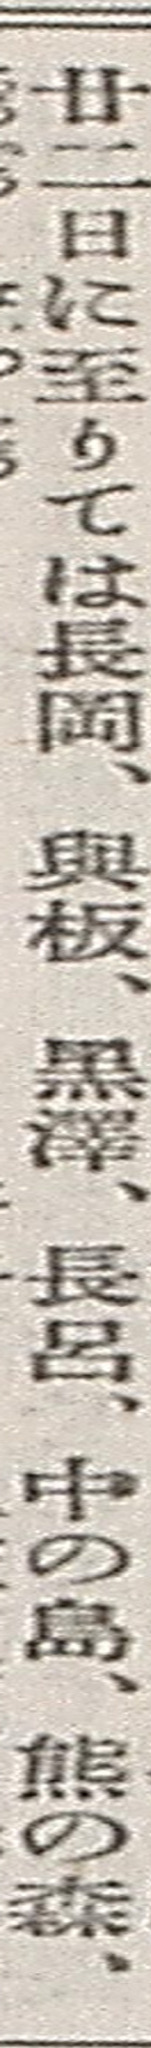廿二日に至りては長岡、与板、黒沢、長呂、中の島、熊の森、
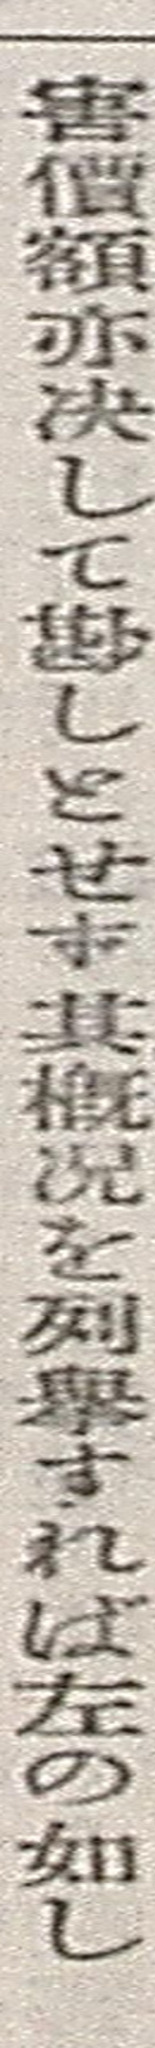害価額亦决して尠しとせず其概況を列挙すれば左の如し
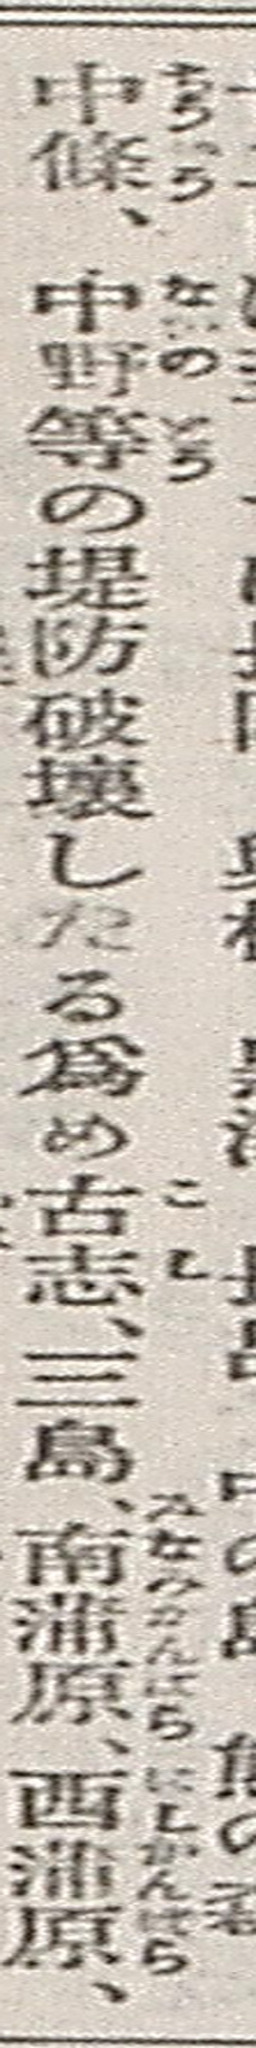中條、中野等の堤防破壊したる為め古志、三島、南蒲原、西蒲原、
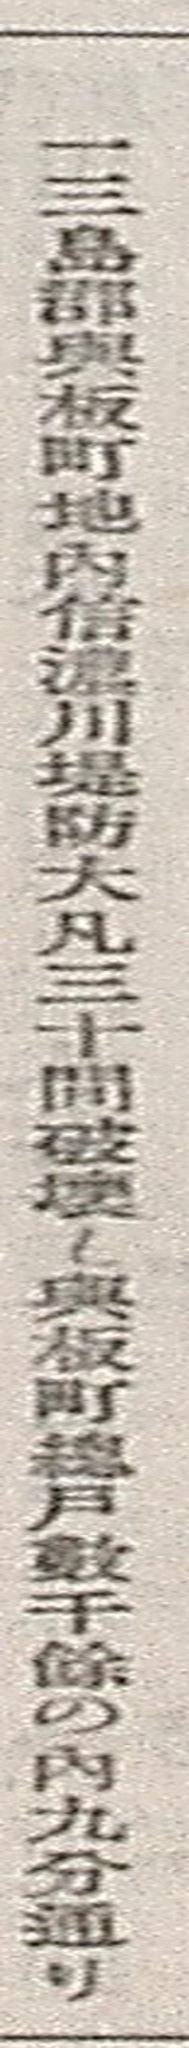一三島郡与板町地内信濃川堤防大凡三十間破壊し与板町総戸数千餘の内九分通り
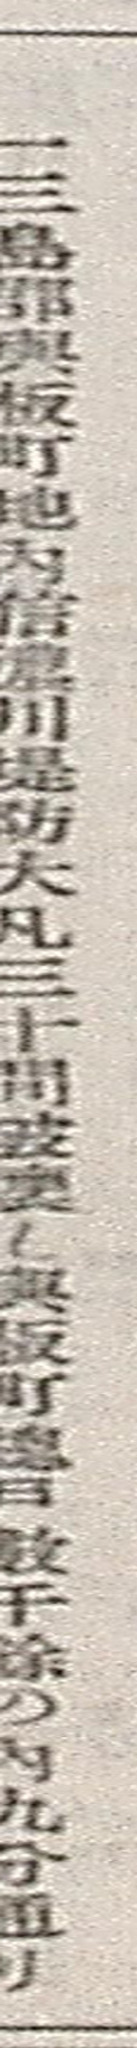一三島郡与板町地内信濃川堤防大凡三十間破壊し与板町総戸数千餘の内九分通り
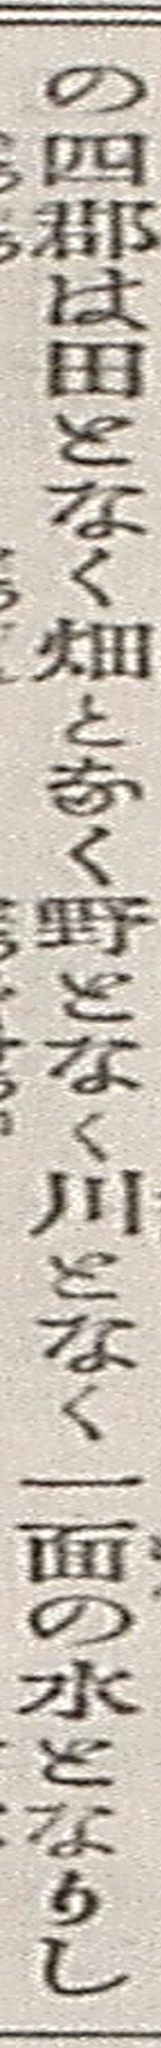の四郡は田となく畑となく野となく川となく一面の水となりし
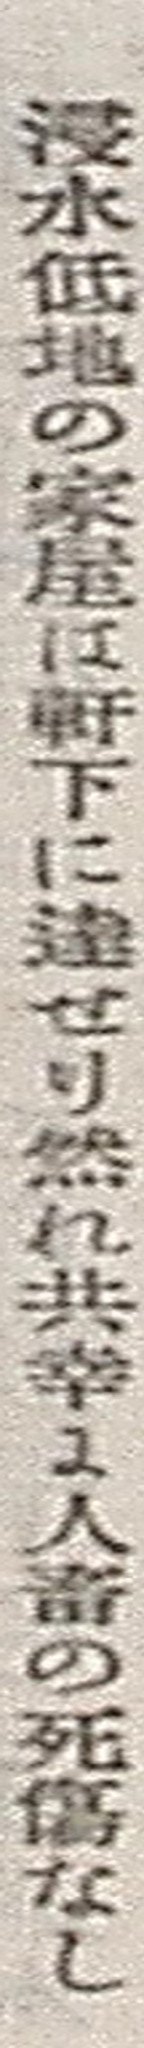浸水低地の家屋は軒下に達せり然れ共幸に人畜の死傷なし
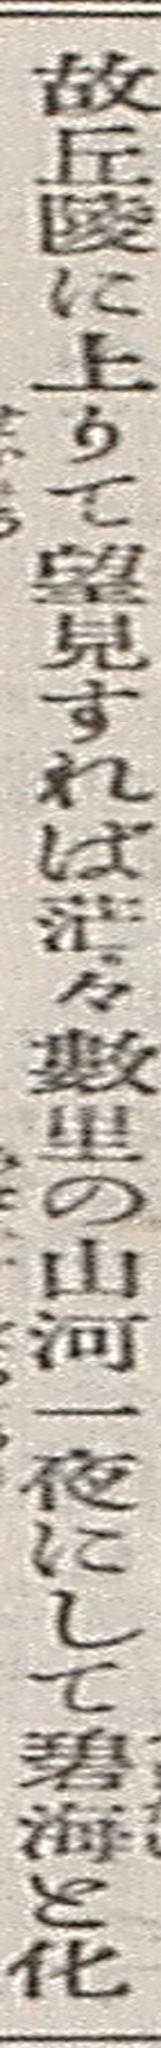故丘陵に上りて望見すれば茫々数里の山河一夜にして碧海と化
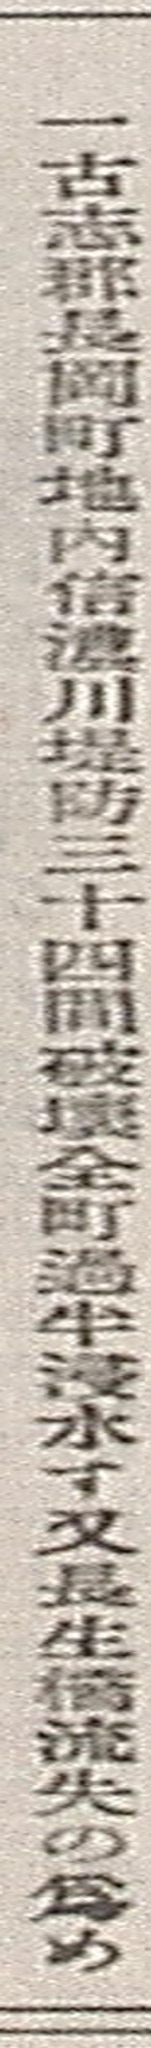一古志郡長岡町地内信濃川堤防三十四間破壊全町過半浸水す又長生橋流失の為め
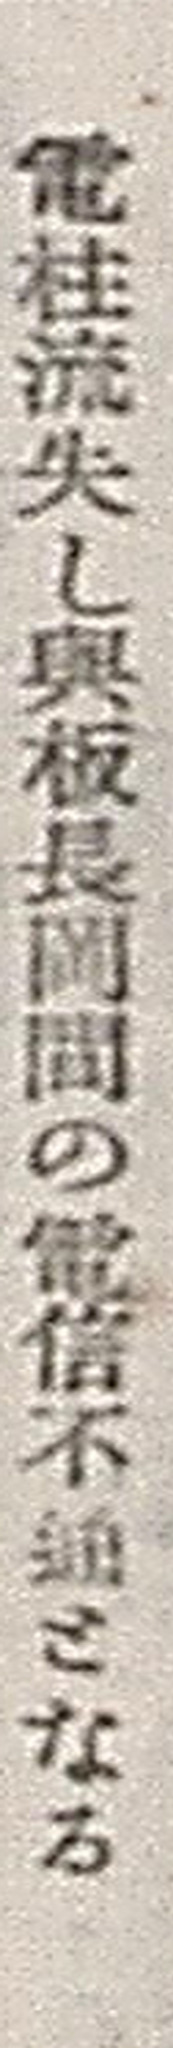電柱流失し与板長岡間の電信不通となる
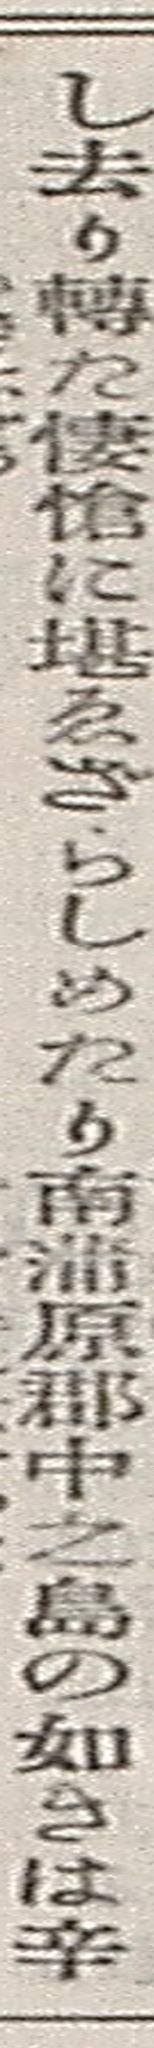し去り転た凄愴に堪えざらしめたり南蒲原郡中之島の如きは辛
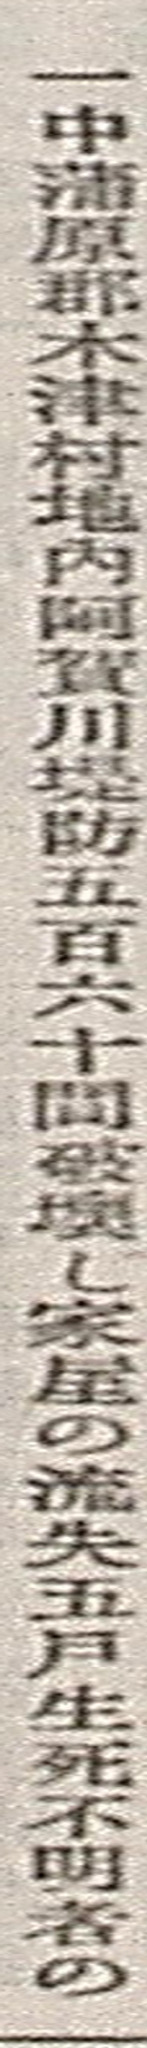一中蒲原郡木津村地内阿賀川堤防五百六十間破壊し家屋の流失五戸生死不明者の
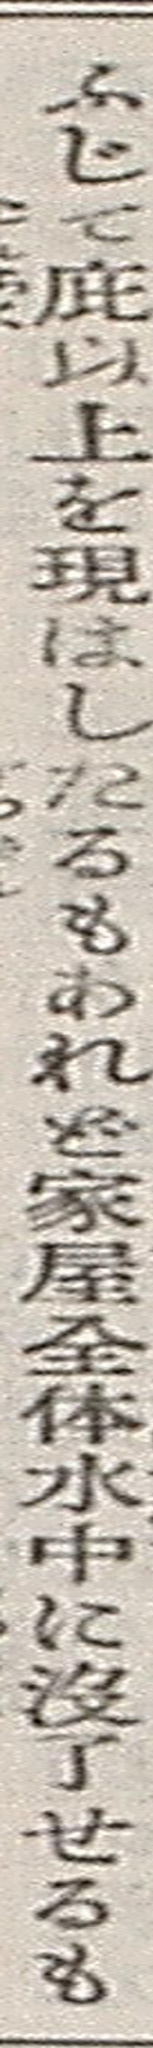ふじて庇以上を現はしたるもあれど家屋全体水中に没了せるも
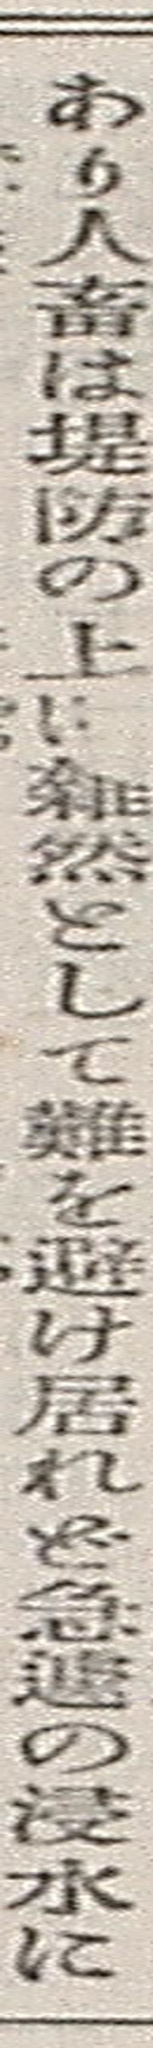あり人畜は堤防の上に雑然として難を避け居れど急遽の浸水に
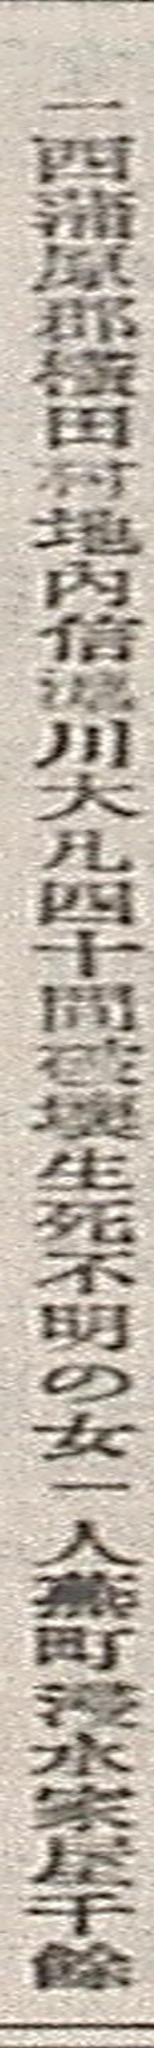一西蒲原郡横田村地内信濃川大凡四十間破壊生死不明の女一人燕町浸水家屋千餘
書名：風俗畫報臨時増刊第百二十八號　洪水被害録（下）
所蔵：東京大学地震研究所図書室 Earthquake Research Institute Library, The University of Tokyo, JAPAN
